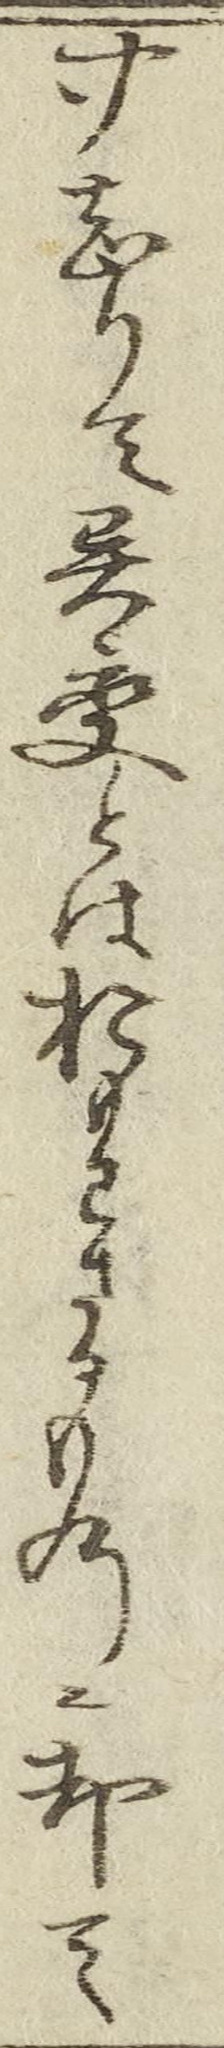聞知りて異変とはおもわさるものに却て
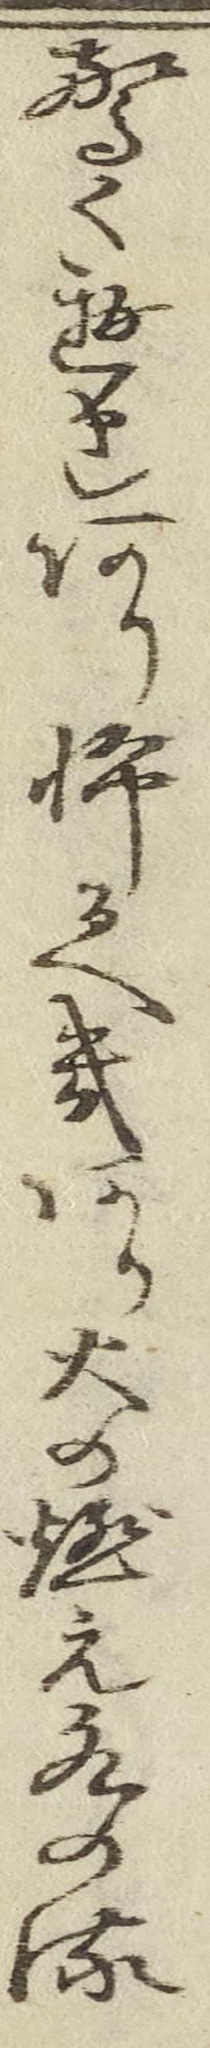驚くへきあり怖るへきあり火の燃え水の流
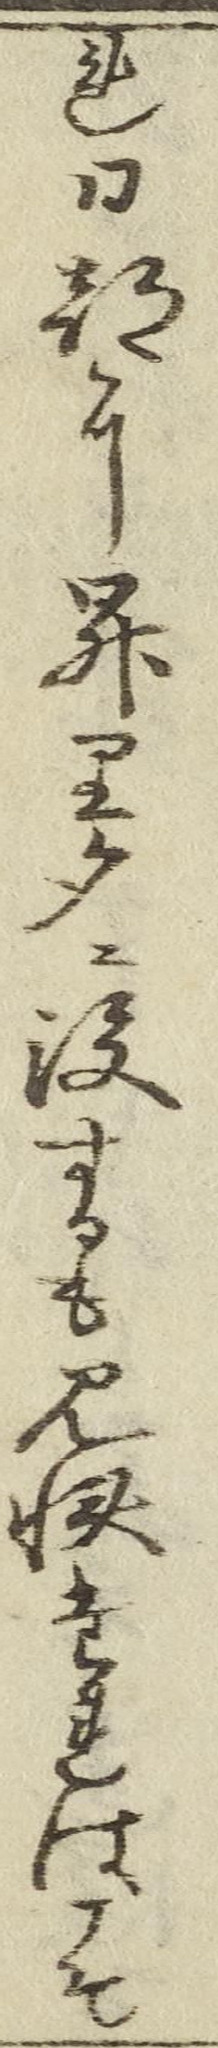れ日朝に昇り夕に没するも見慣？たれはこそ
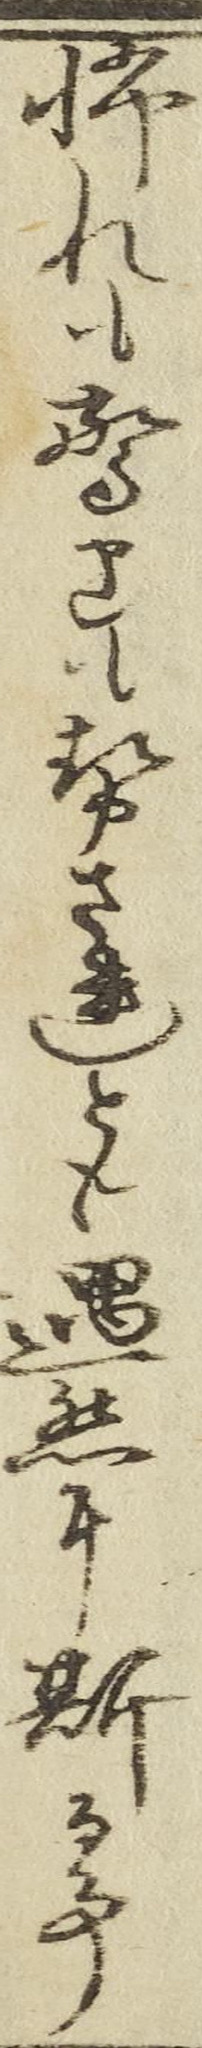怖れも驚きもせされとも遇然に斯る事
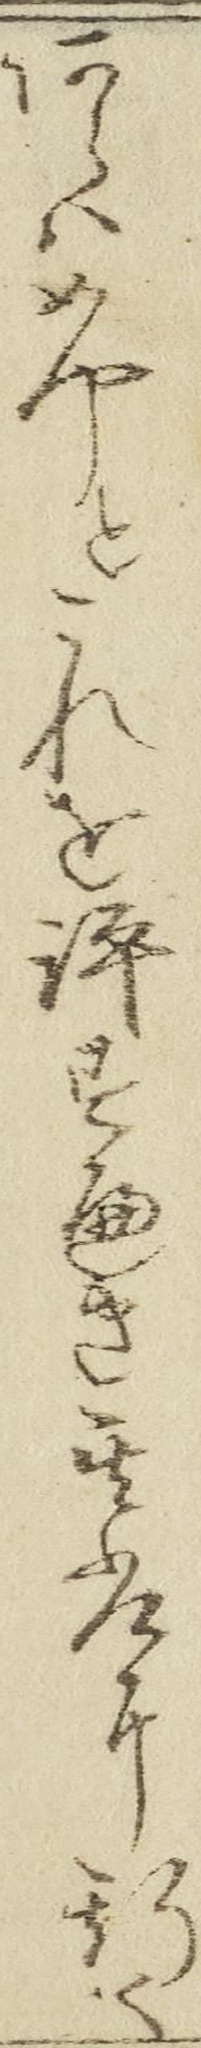あらは如何とこれを評すへき其常に斯く
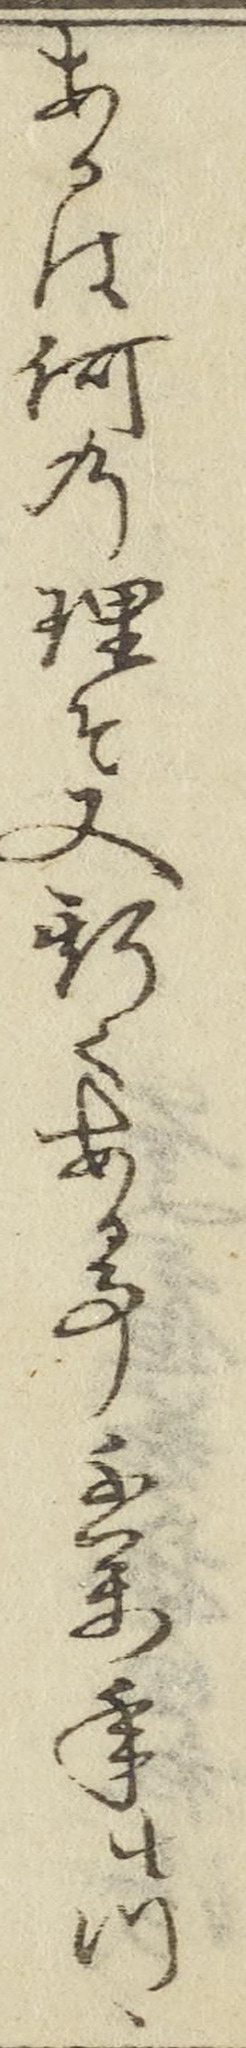あるは何の理そ又斯くある事千万年もつゝ
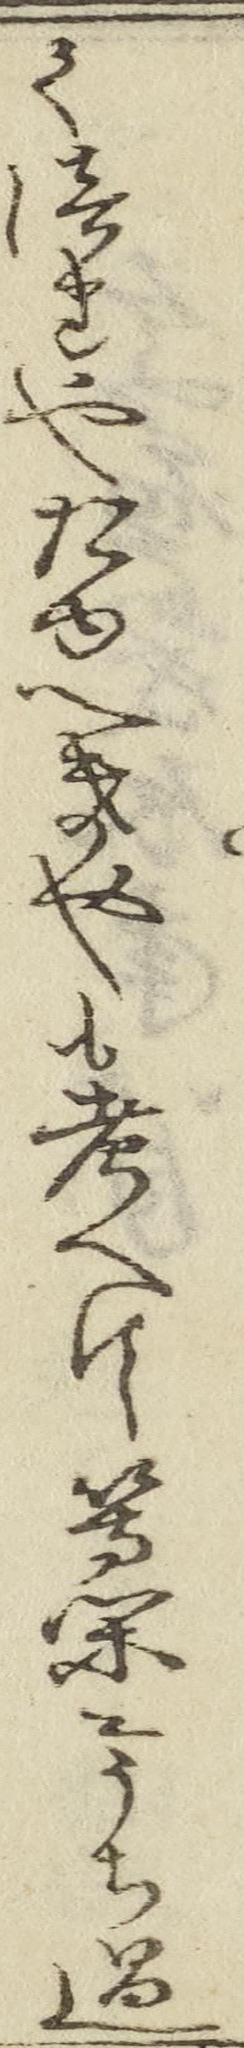くへきやたゆへきやも考へす等閑にうち過
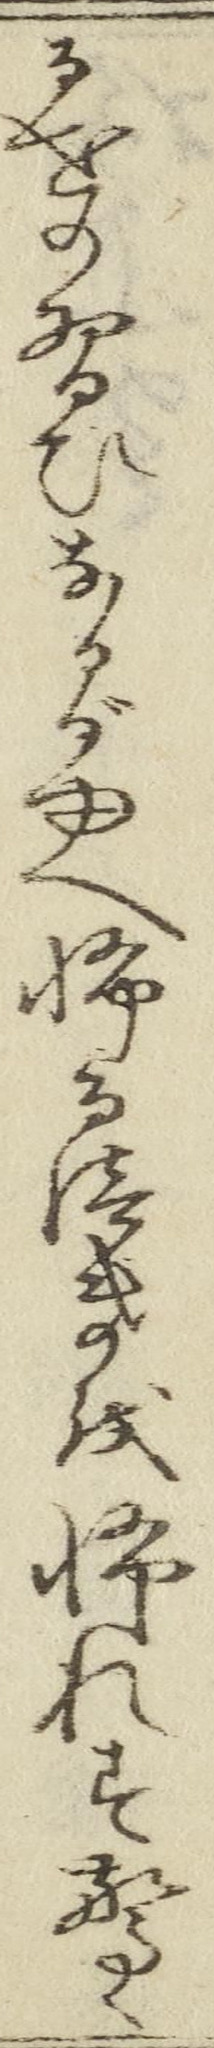る世の習ひなるがゆへ怖るへきを怖れす驚く
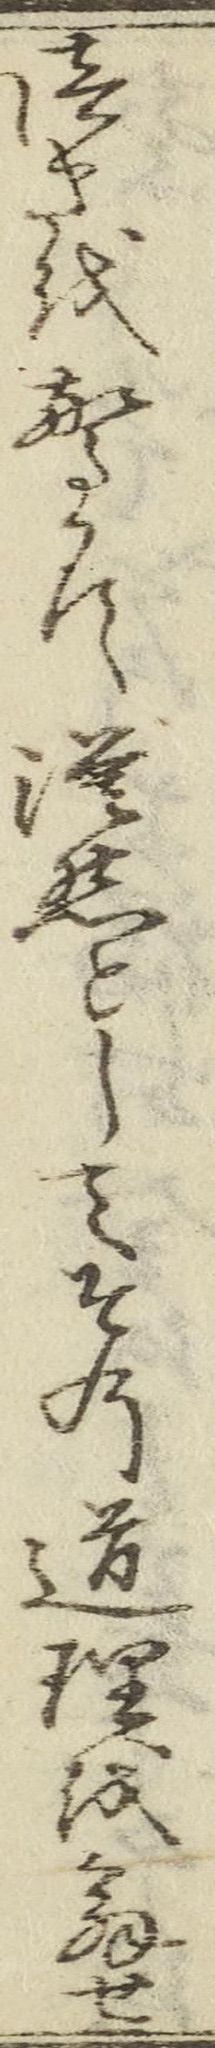へきを驚かす漠然としてはその道理を解せ
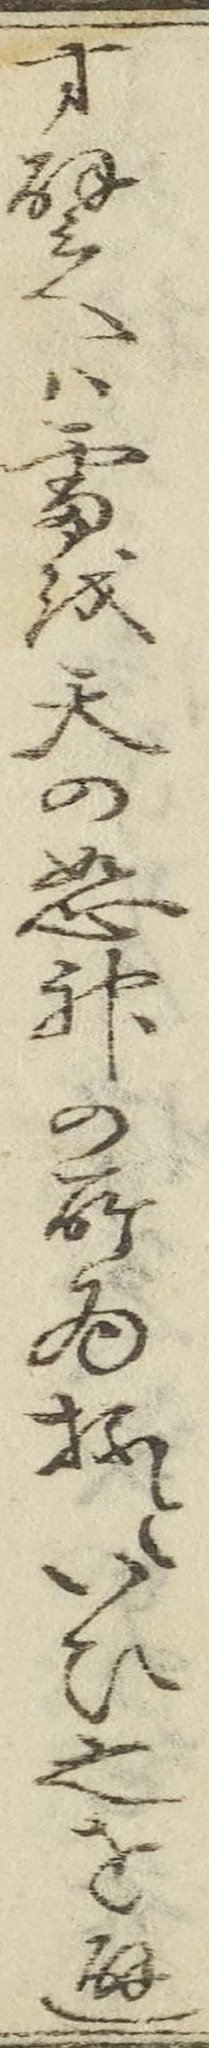す譬へは雷を天の怒神の所為抔といひ之を避
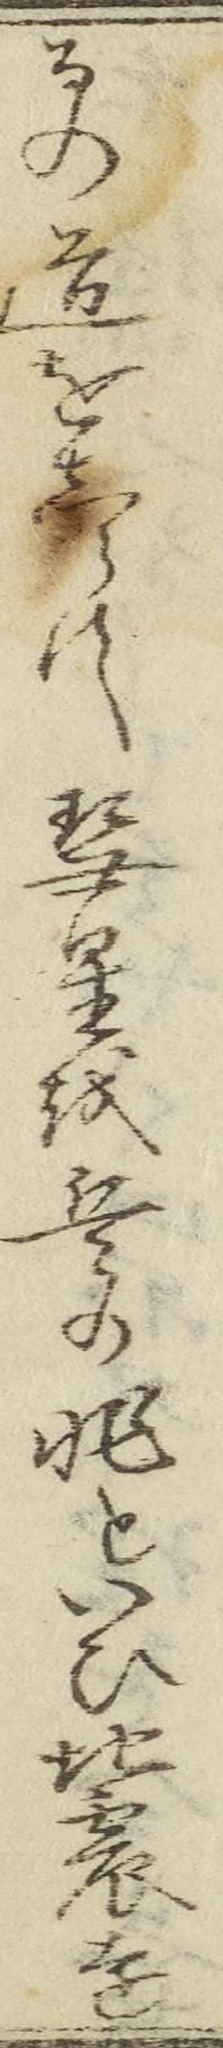るの道をしらす彗星を兵の兆といひ地震を
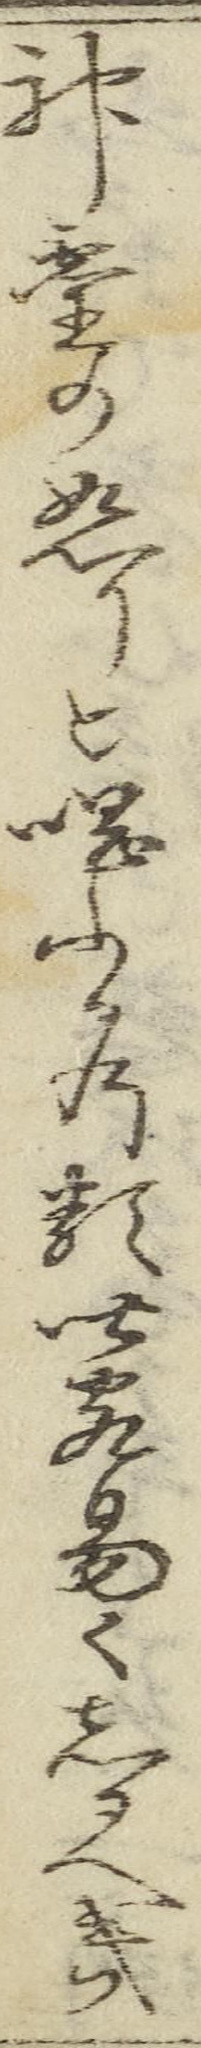神霊の怒りと唱ふるの類皆容易くしるへき
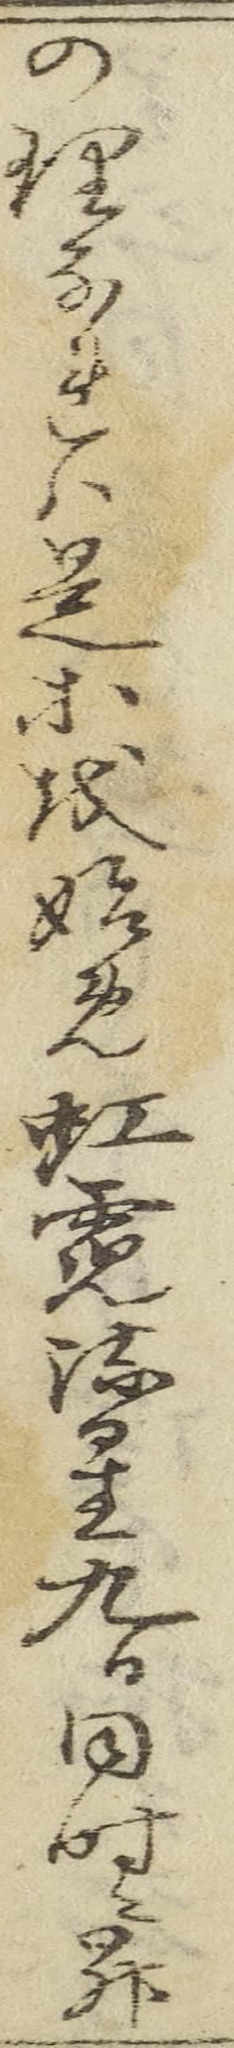の理なれは是等を始め虹霓流星九日同時に昇

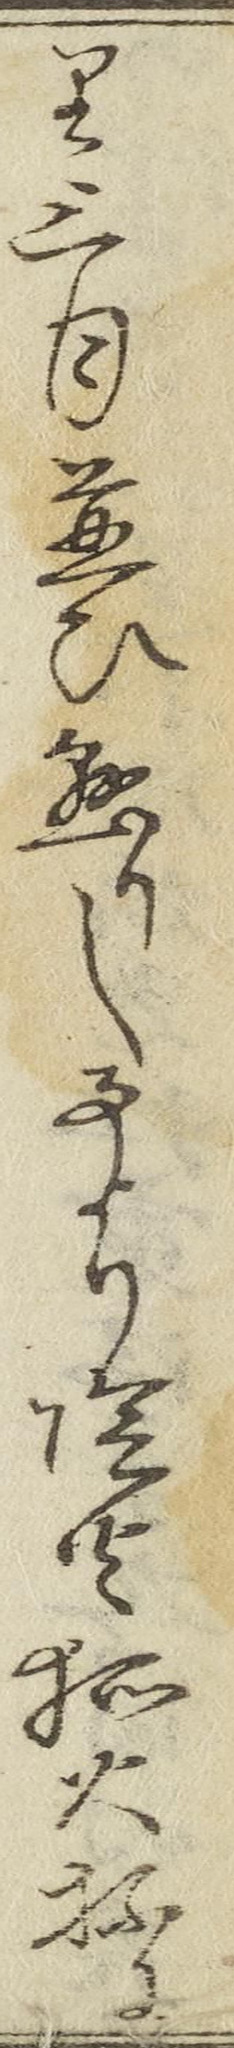り三月並ひ懸りし事より陰火狐火抔に
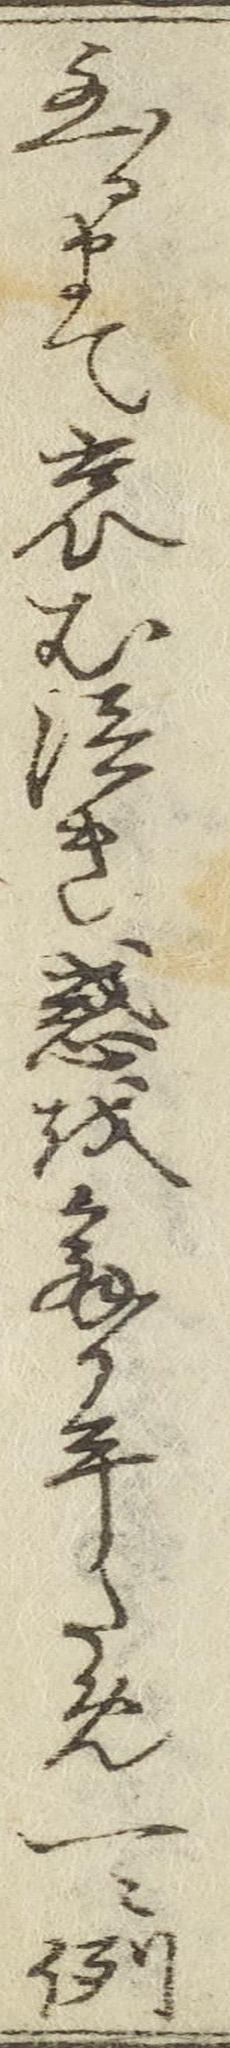至るまて哀むへき惑を解かむため一々例
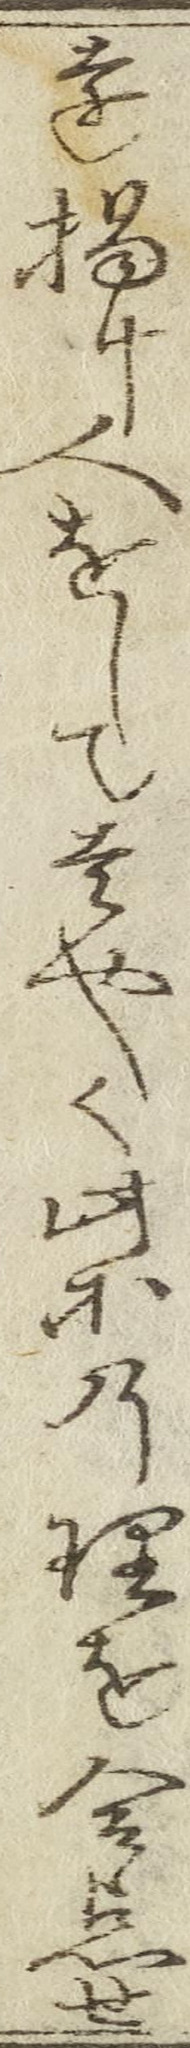を掲け人をしてはやく此等の理を合点せ
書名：天変地異
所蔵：東京大学地震研究所図書室 Earthquake Research Institute Library, The University of Tokyo, JAPAN
